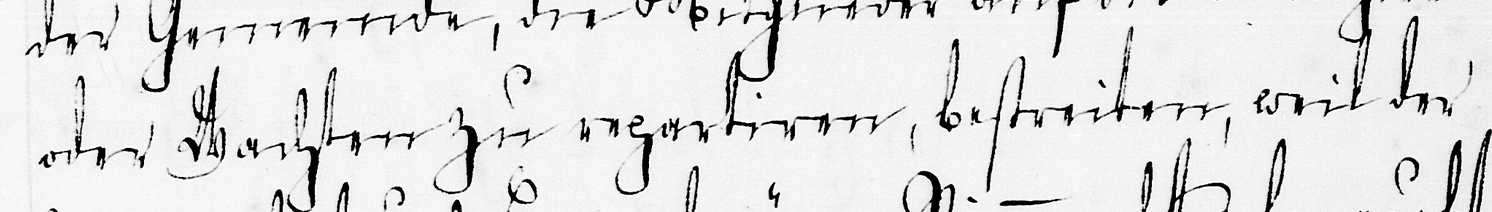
oder Wachten zu repartiren, bestreiten, weil der
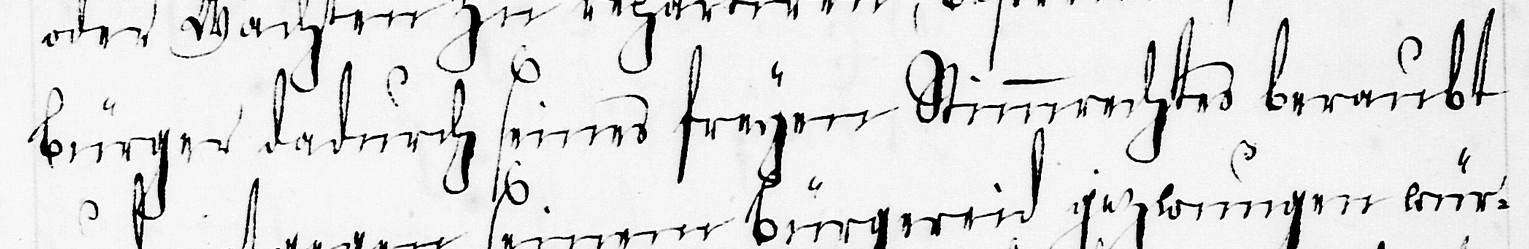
Bürger dadurch seines freyen Stimmrechtes beraubt
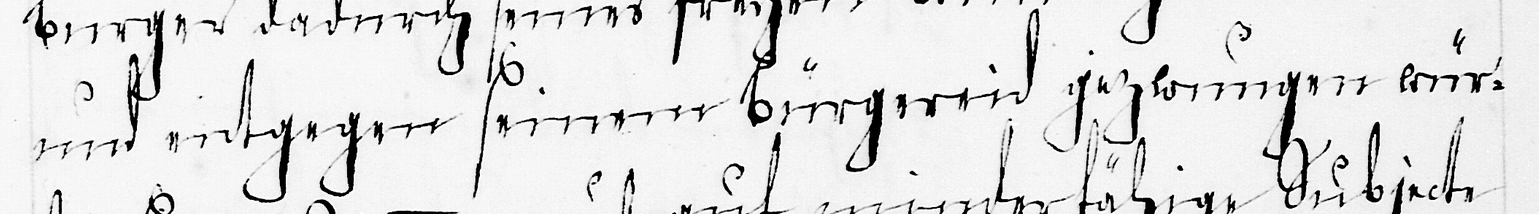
und entgegen seinem Bürgereid gezwungen wür¬
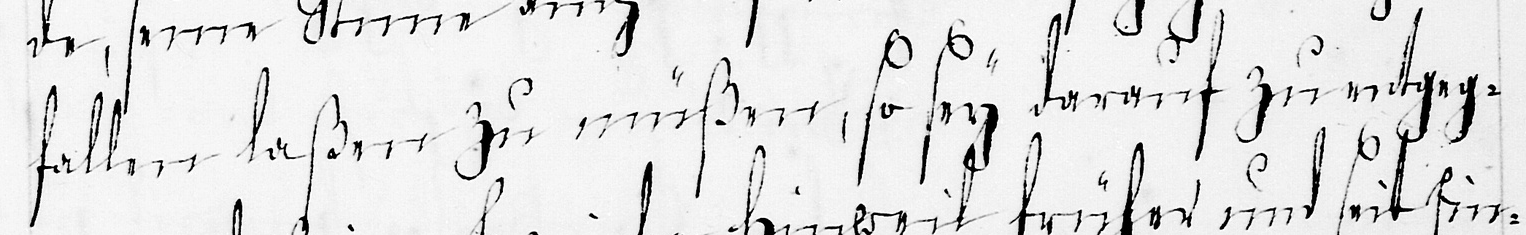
fallen laßen zu müßen, so sey darauf zu entgeg¬
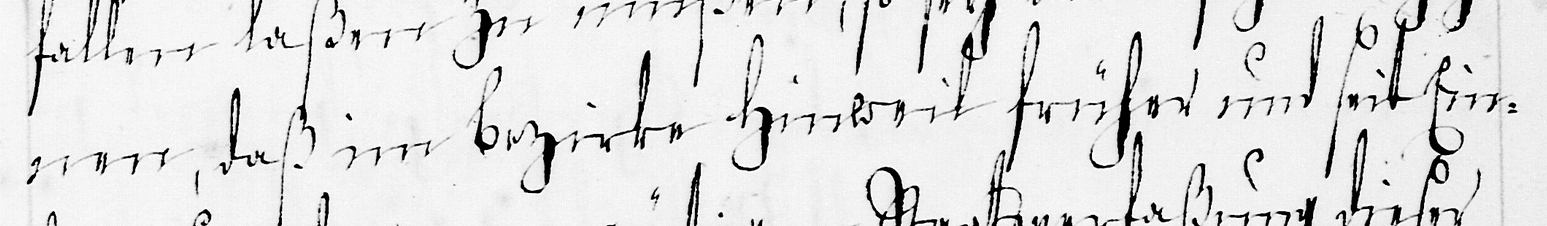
en, daß im Bezirke Hinweil früher und seit Ein¬
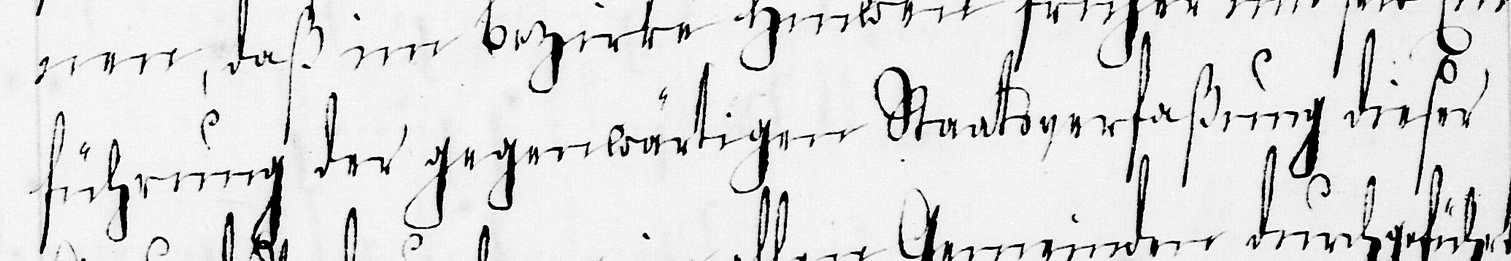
führung der gegenwärtigen Staatsverfaßung dieser
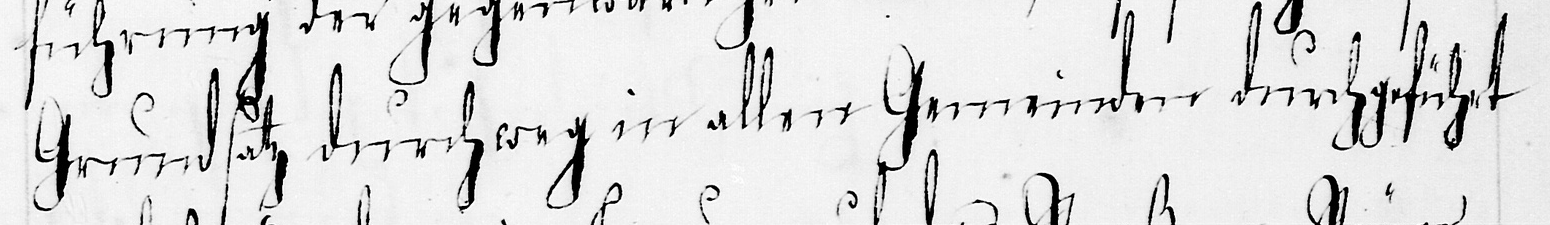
Grundsatz durchweg in allen Gemeinden durchgeführt
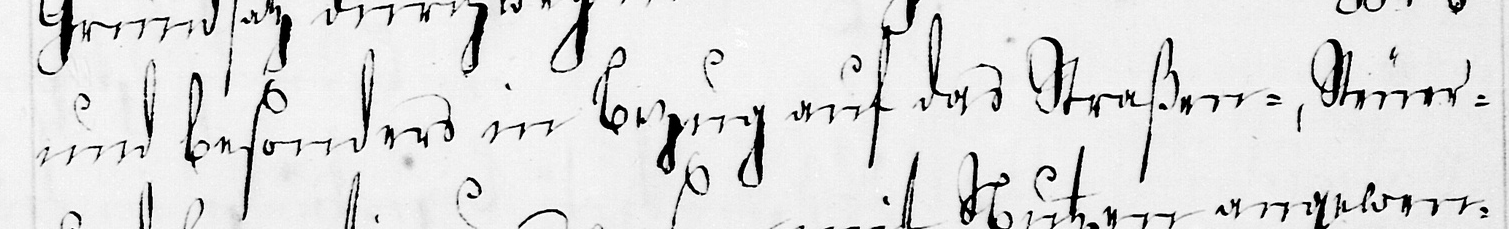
und besonders in Bezug auf das Straßen-, Steuer-
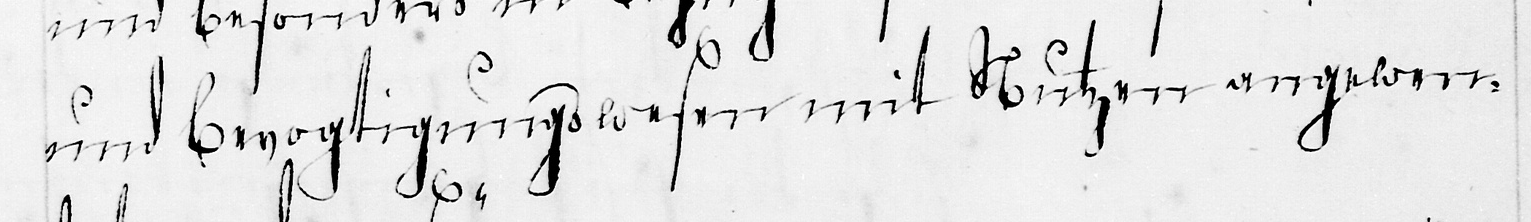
und Bevogtigungswesen mit Nutzen angewen¬
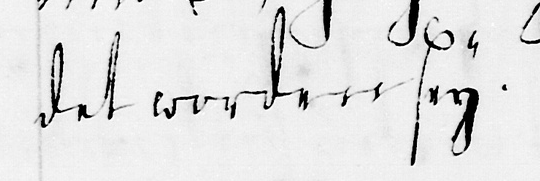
det worden sey.
